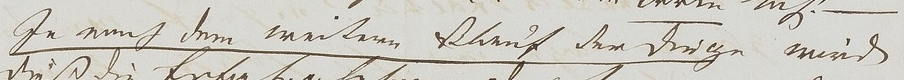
Je nach dem weitern Vlauf der Dinge wird
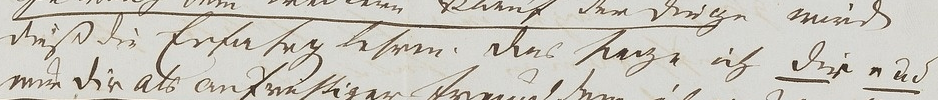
dieß die Erfahrg lehren. Das sage ich dir und
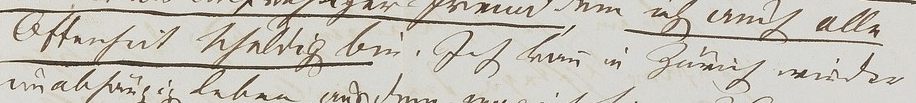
Offenheit schuldig bin. Ich kann in Zürich wieder
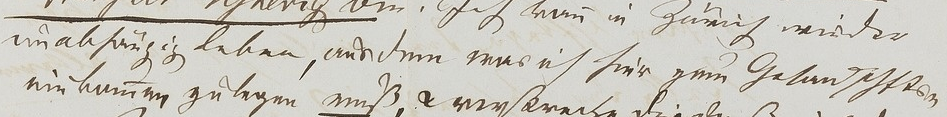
unabghängig leben, aus dem was ich hier zum Gesandtschfts-
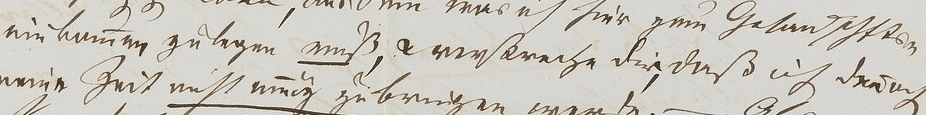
einkommen zulegen muß, & verspreche dir, daß ich dennoch
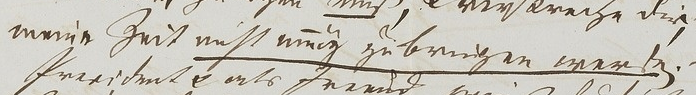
meine Zeit nicht unnüz zubringen werde. –
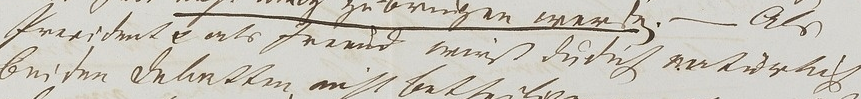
President & als Freund wirst du dich natürlich
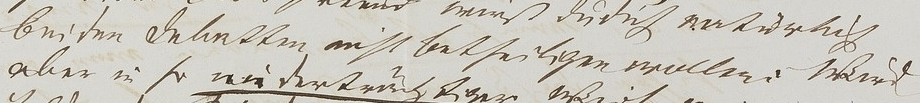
bei den Debatten nicht betheiligen wollen: Wird
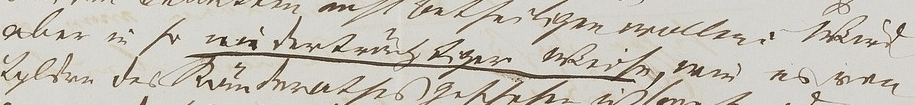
aber in so niederträchtiger Weise, wie es von
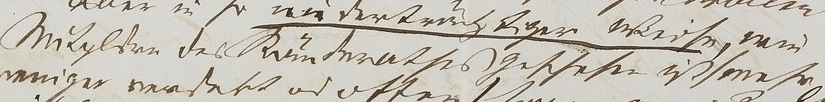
Mitgldern des Ständerathes geschehen ist (mehr
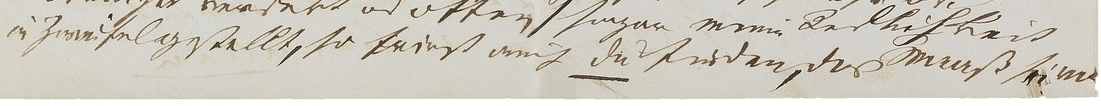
in Zweifel gestellt, so wirst auch Du finden, das Maaß sei voll. –
